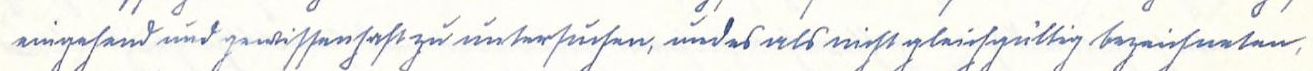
eingehend und gewissenhaft zu untersuchen, und es deshalb nicht gleichgültig bezeichneten,
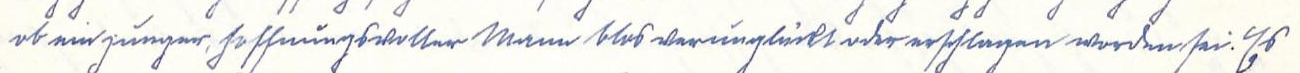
ob ein junger, hoffnungsvoller Mann bloß verunglückt oder erschlagen worden ist. Es wäre
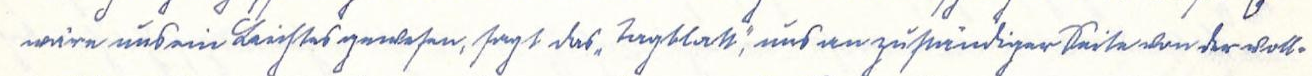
uns ein Leichtes gewesen, sagt das „Tagblatt“, uns an zuständiger Seite von der voll-
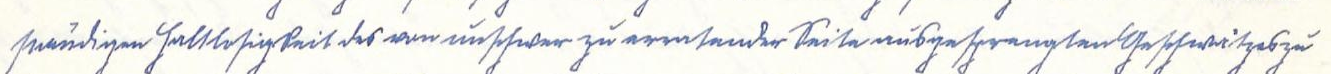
ständigen Haltlosigkeit des von unschwer zu erratender Seite ausgesprengten Geschwätzes zu
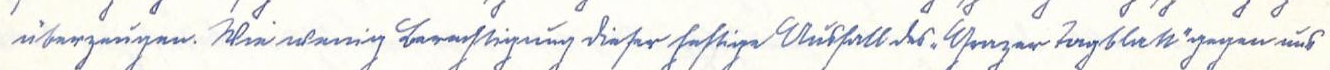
überzeugen. Wie wenig Berechtigung dieser heftige Ausfall des „Grazer Tagblatt“ gegen uns
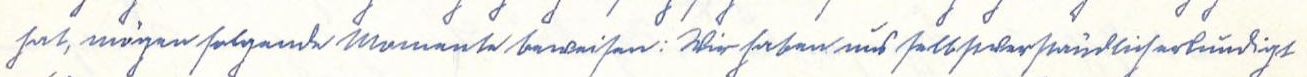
hat, mögen folgende Momente beweisen: Wir haben uns selbst selbstverständlich erkundigt
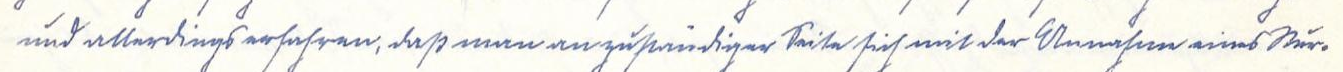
und allerdings erfahren, dass man an zuständiger Seite sich mit der Annahme eines Stur-
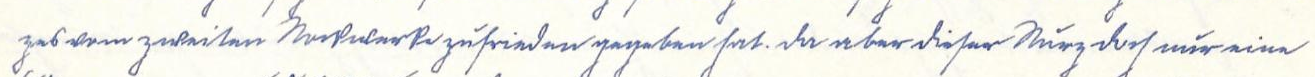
zes vom zweiten Stockwerke zufriedengegeben hat. Da aber dieser Sturz doch nur eine
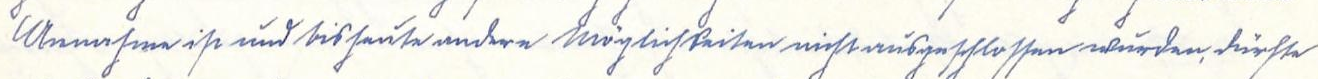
Annahme ist und bis heute andere Möglichkeiten nicht ausgeschlossen wurden, dürfte
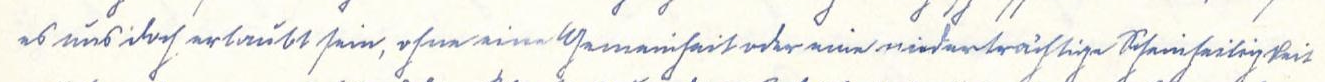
es uns doch erlaubt sein, ohne eine Gemeinheit oder eine niederträchtige Scheinheiligkeit
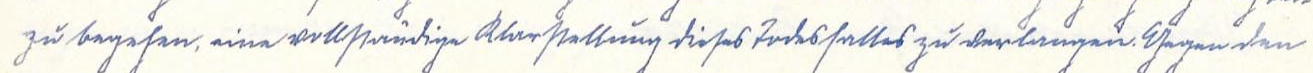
zu begehen, eine vollständige Klarstellung des Todesfalles zu verlangen. Gegen den
